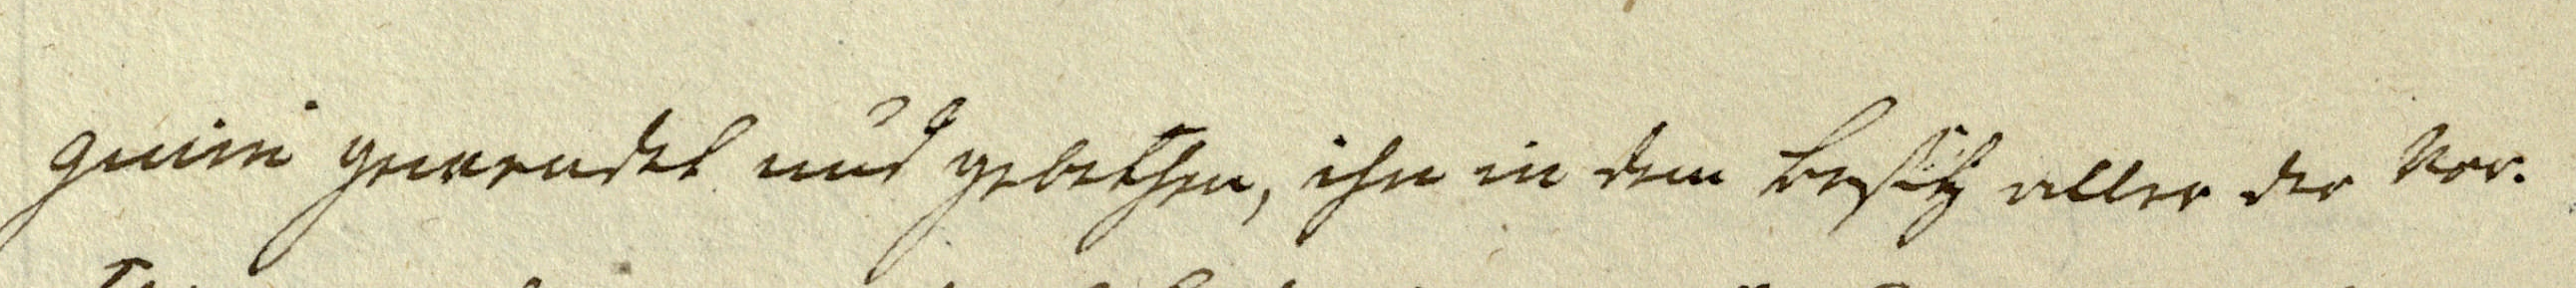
gium gewendet und gebethen, ihn in dem Besitz aller der Vor¬
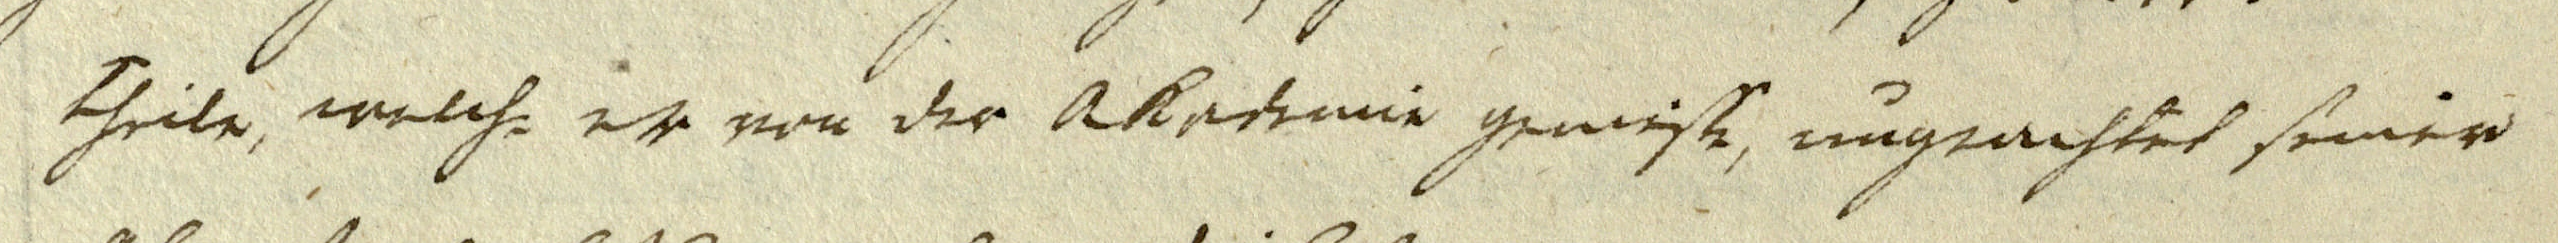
theile, welche er von der Akademie geniesse, ungeachtet seiner
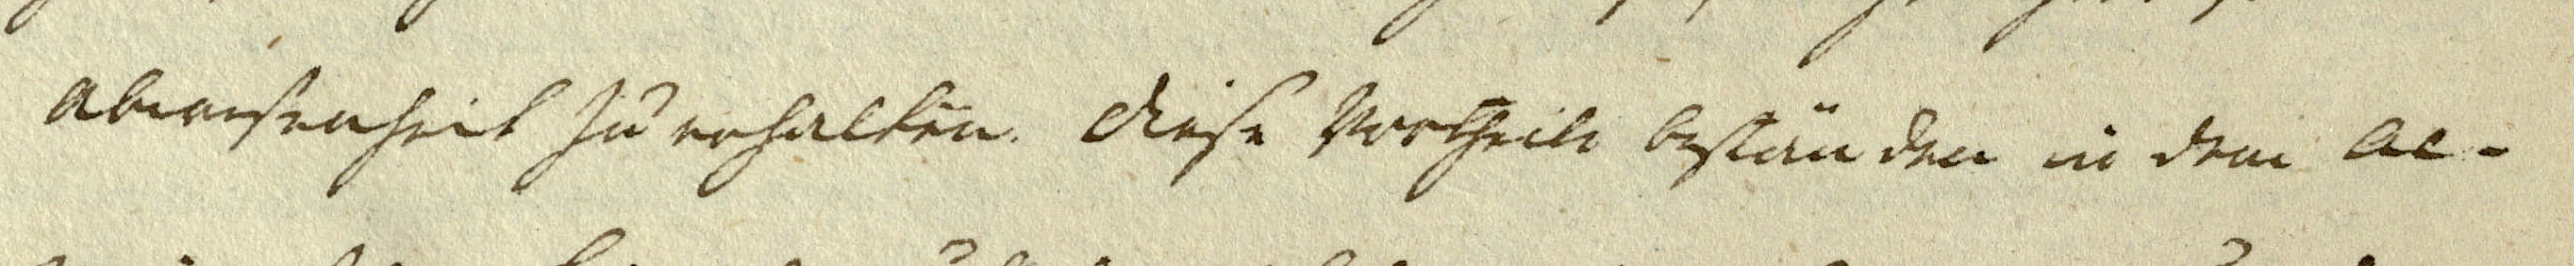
Abwesenheit zu erhalten. Diese Vortheile beständen in dem Ae¬
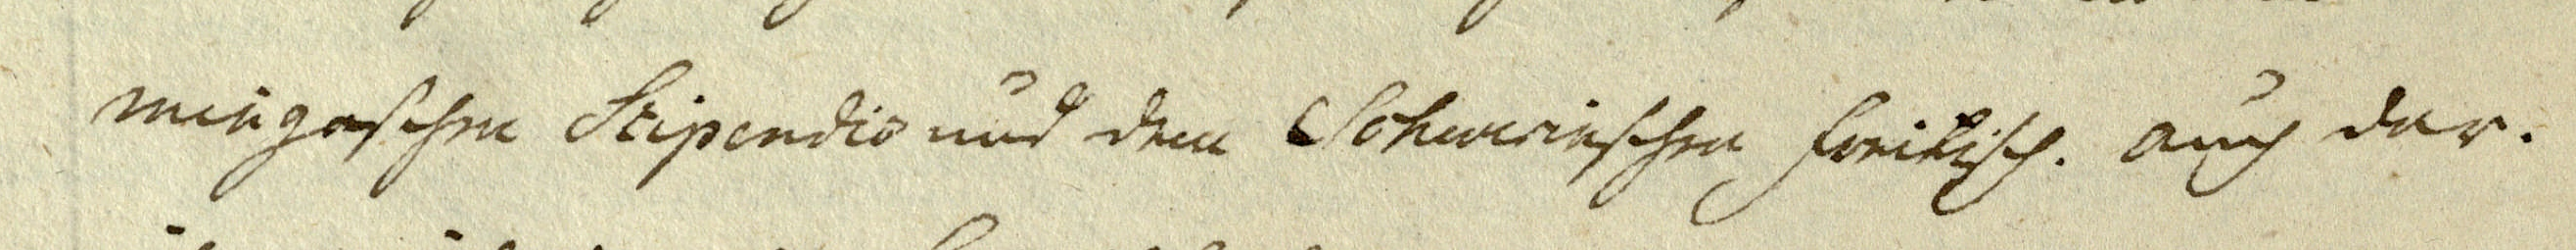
mingaschen Stipendio und dem Schwerinschen Freitisch. Auch dar¬
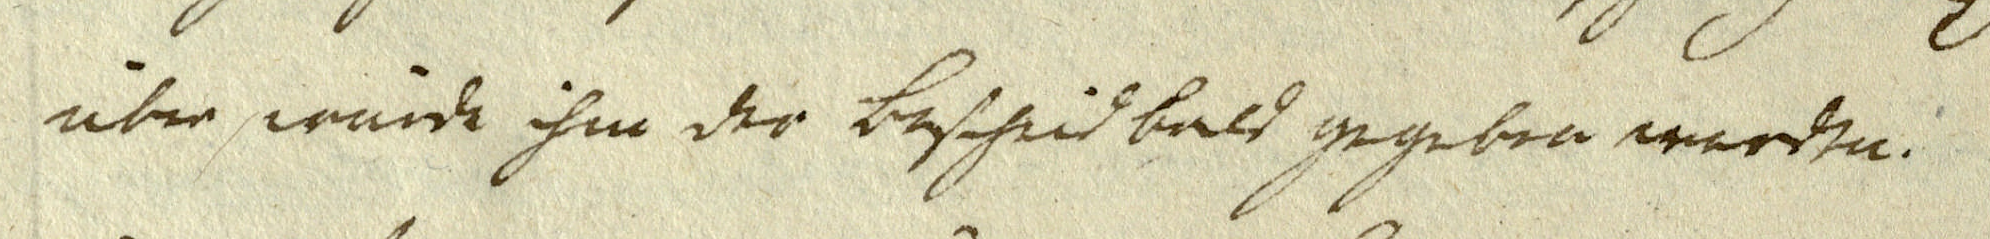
über würde ihm der Bescheid bald gegeben werden.
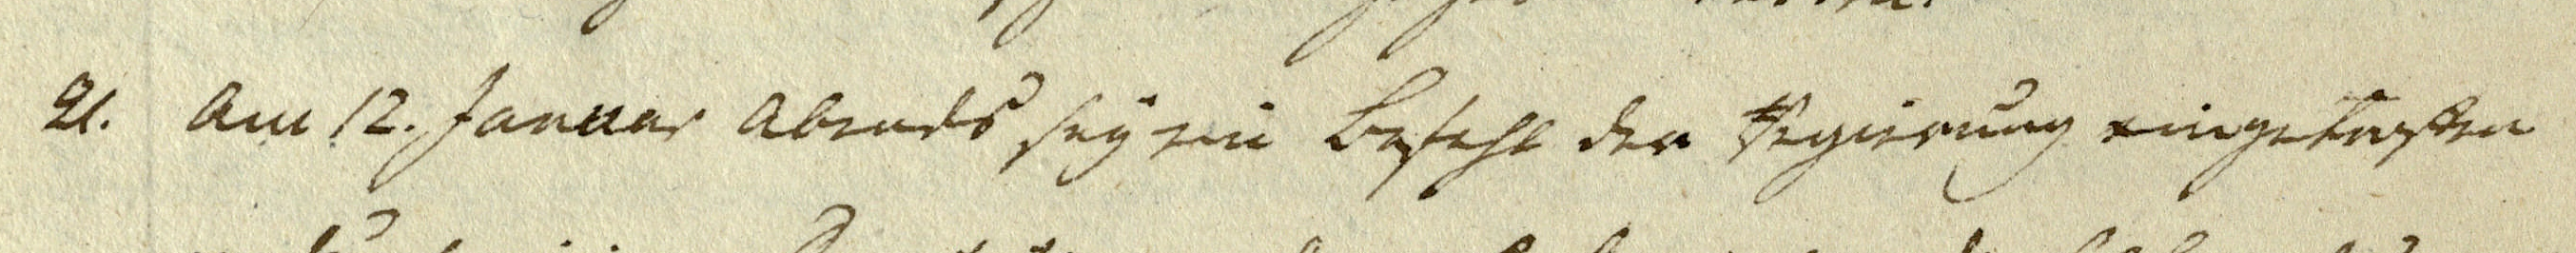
21. Am 12. Januar Abends seÿ ein Befehl der Regierung eingetroffen
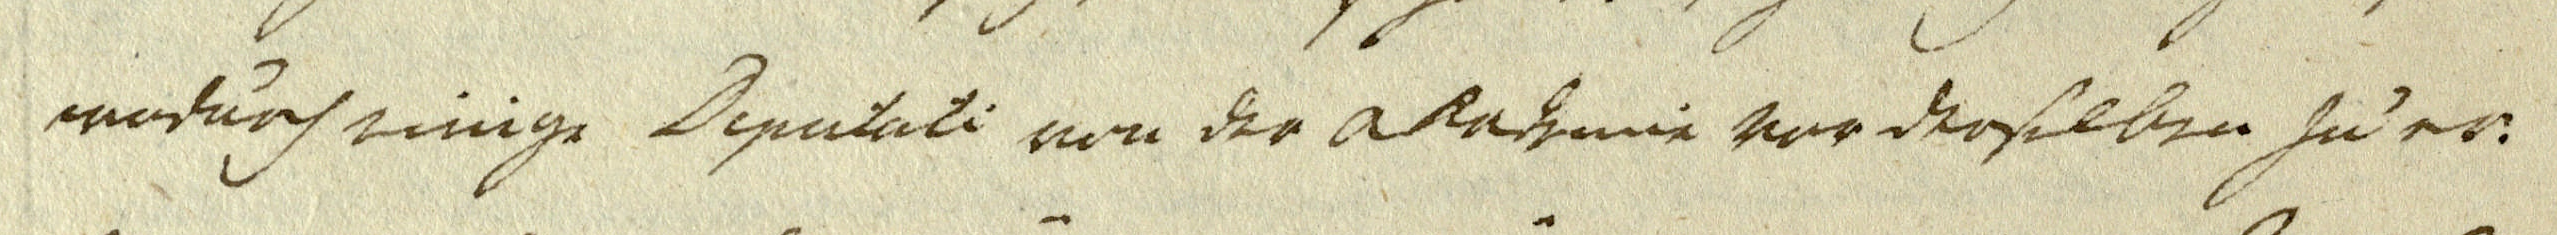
wodurch einige Deputati von der Akademie vor derselben zu er¬
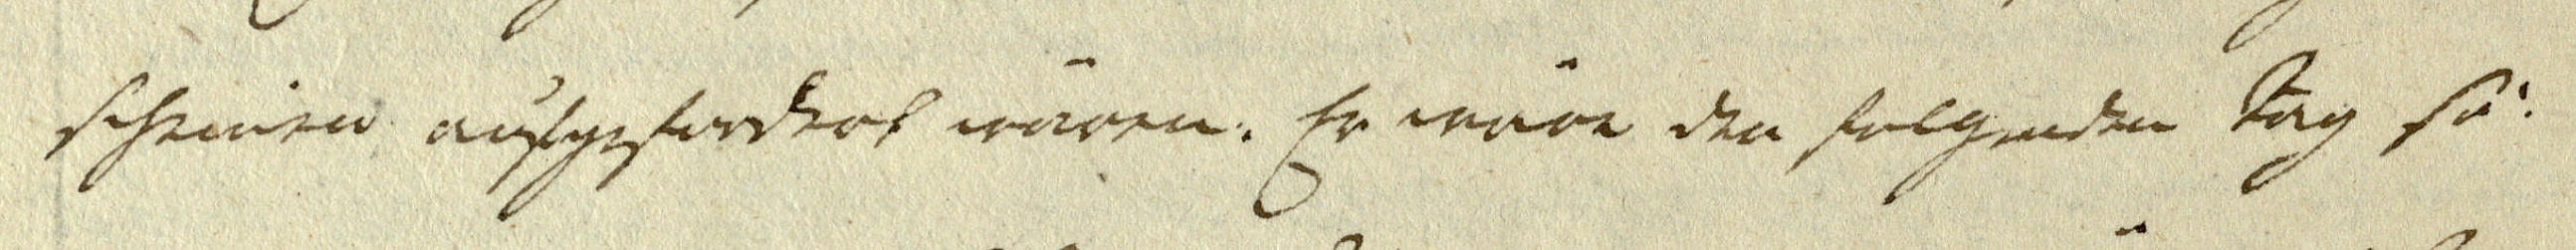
scheinen aufgefordert wären. Er wäre den folgenden Tag so¬
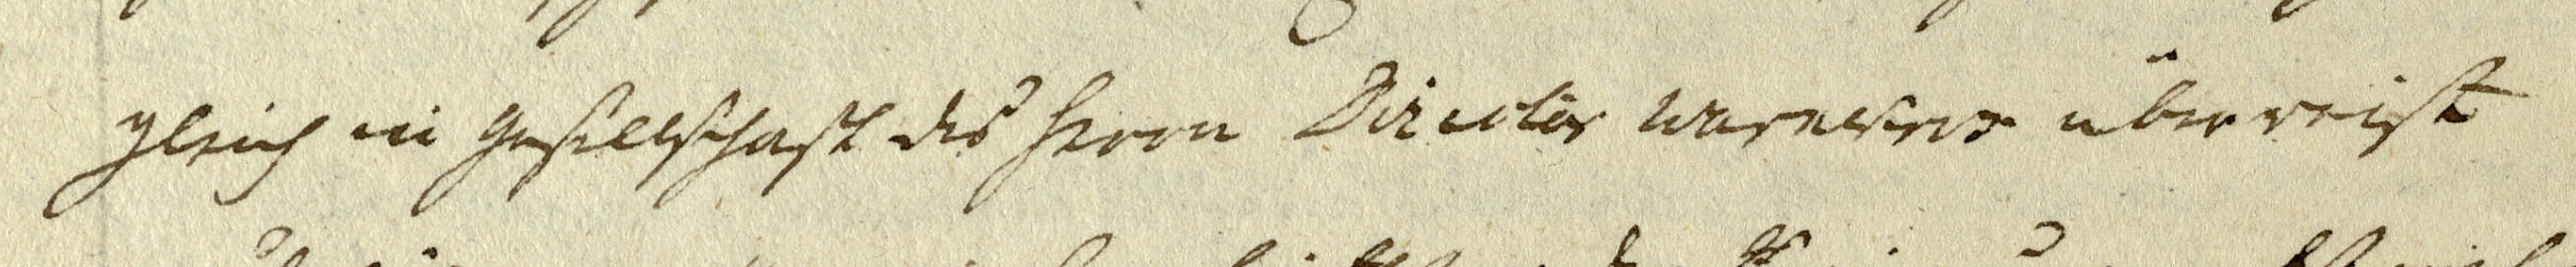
gleich in Gesellschaft des Herrn Director Warnekros überreist
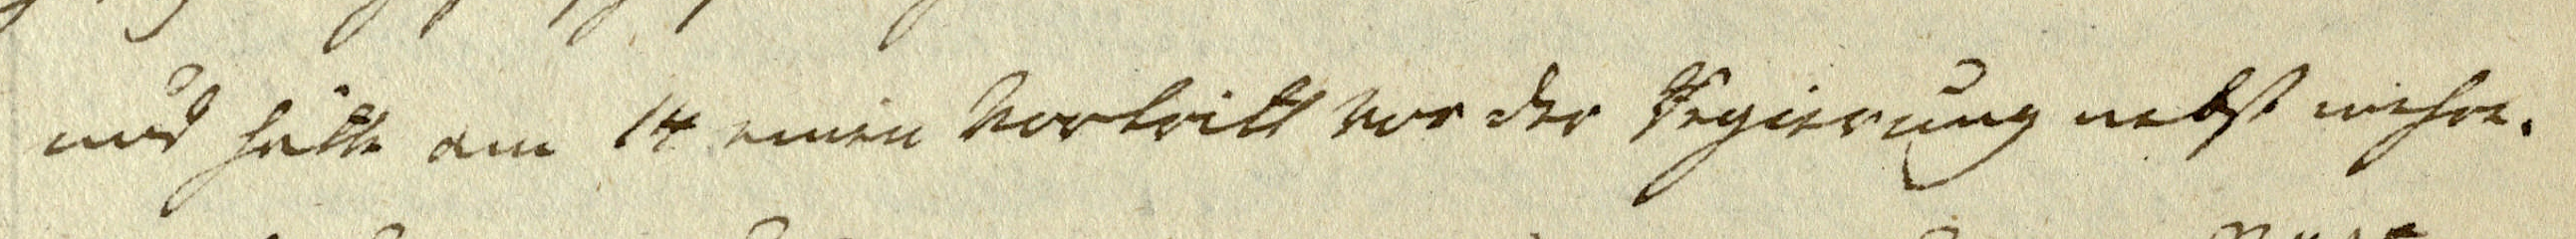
und hätte am 14. einen Vortritt vor der Regierung nebst mehre¬
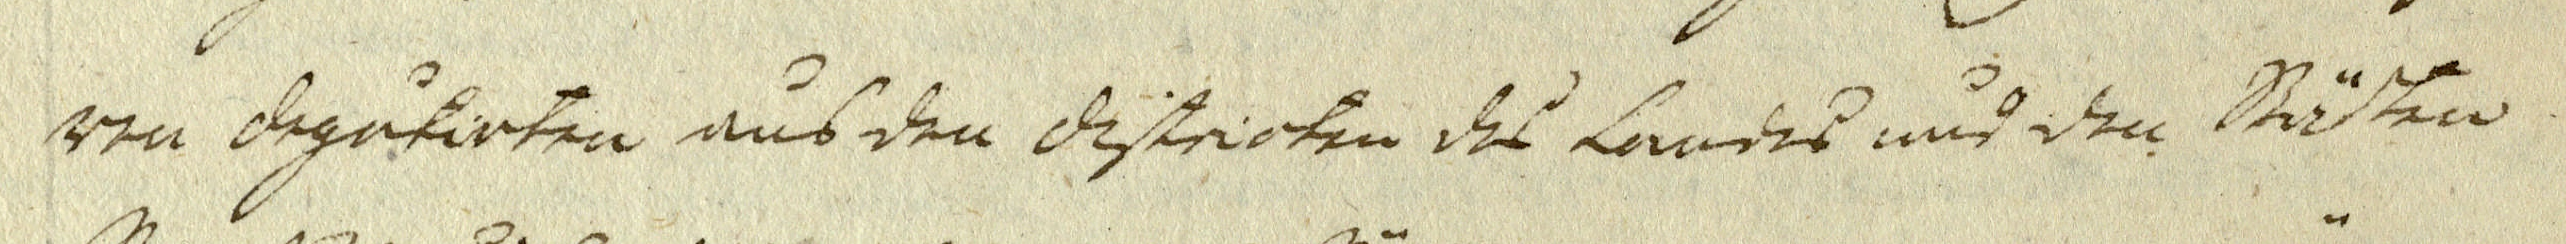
ren Deputirten aus den Districten des Landes und den Städten
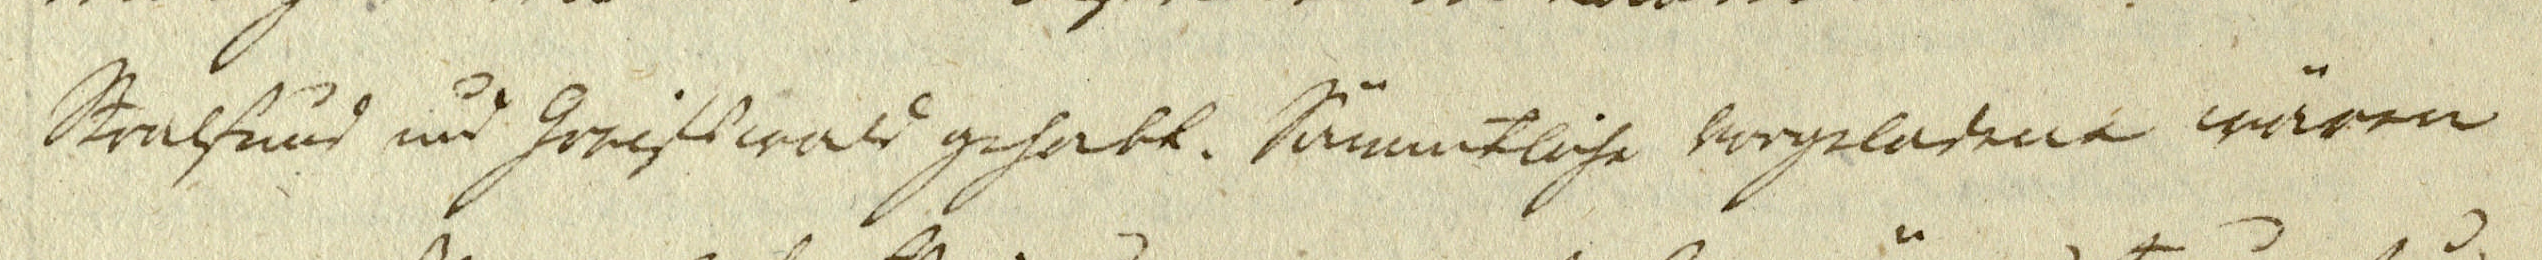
Stralsund und Greifswald gehabt. Sämmtliche Vorgeladene wären
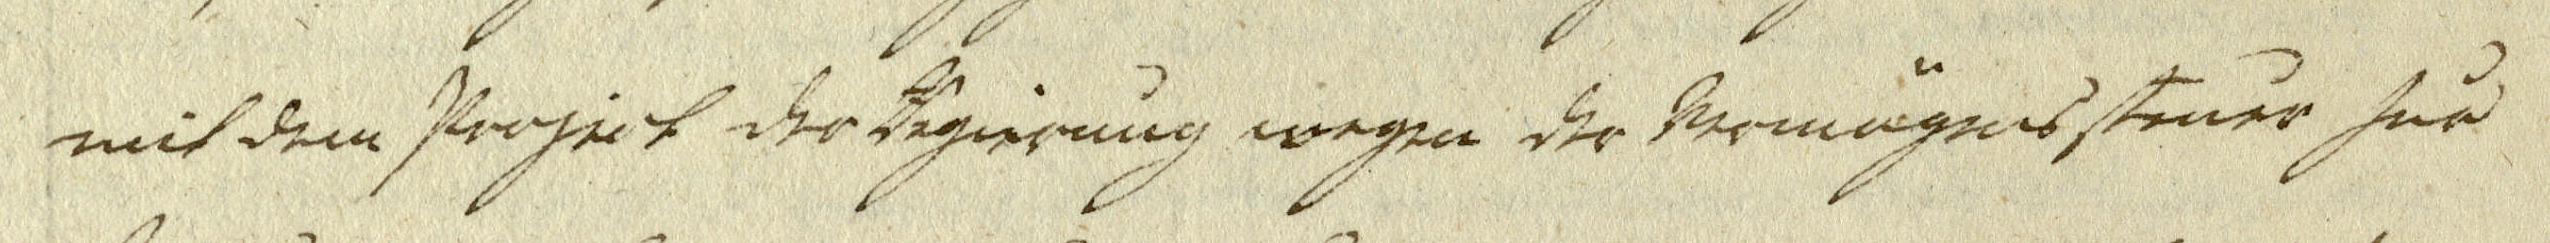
mit dem Project der Regierung wegen der Vermögenssteuer zur
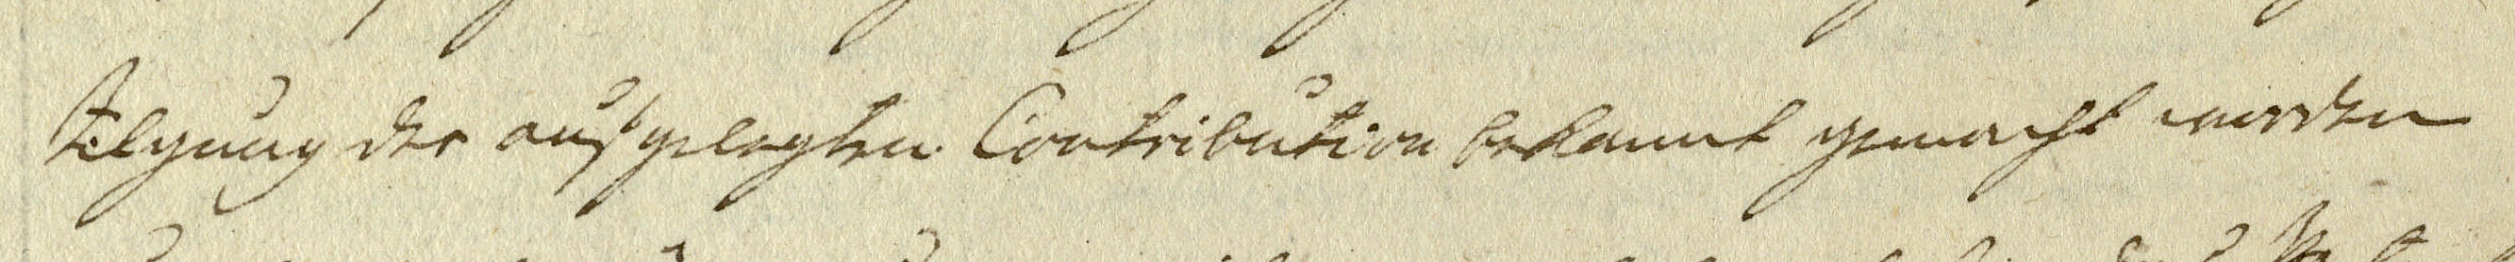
Tilgung der aufgelegten Contribution bekannt gemacht worden
